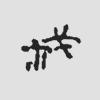{弋示}
